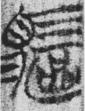驅
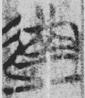○（失）
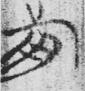前
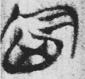○（禽）
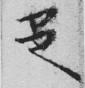邑
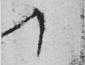人
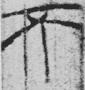不
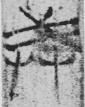戒
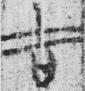吉
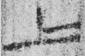上
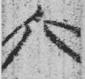六
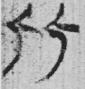比
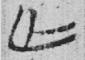亡（无）
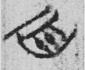首
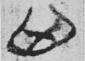凶
